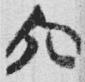六
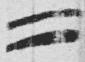二
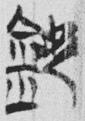欽（感）
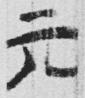亓（其）
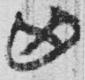凶
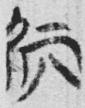凥（居）
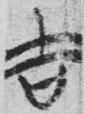吉
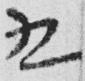九
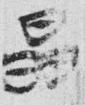晶
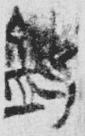欽（感）
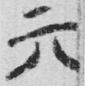亓（其）
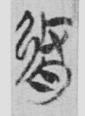腓
